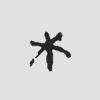木
